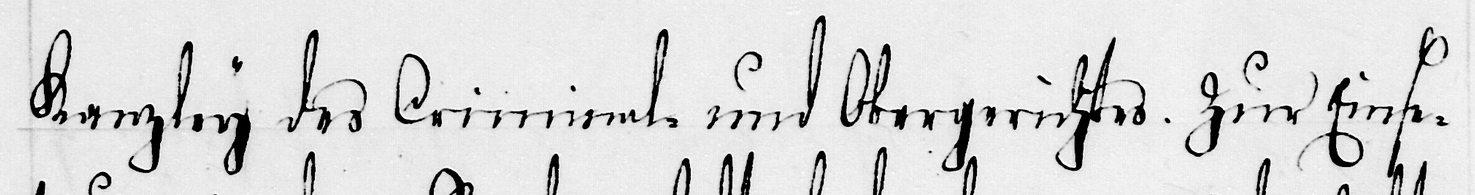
Kanzley des Criminal- und Obergerichtes. Zur Einse¬
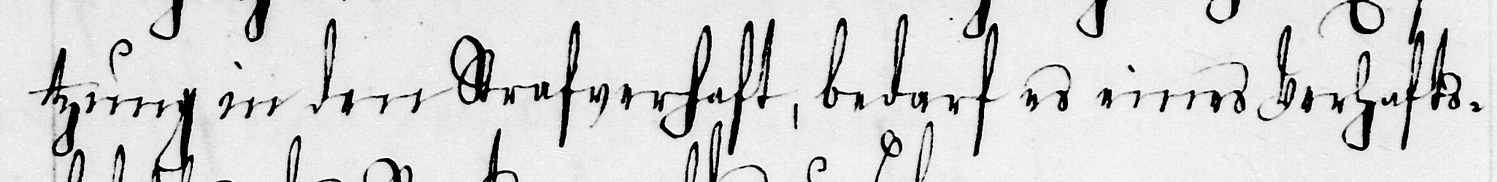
tzung in den Strafverhaft, bedarf es eines Verhafts¬
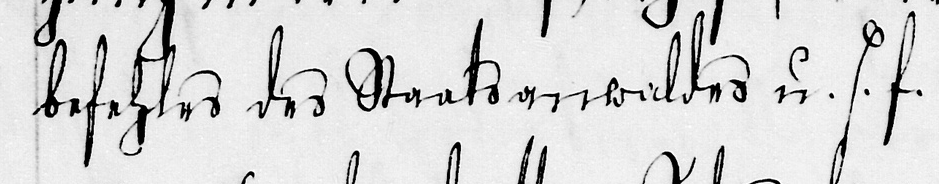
befehles des Staatsanwaldes u. s. f.
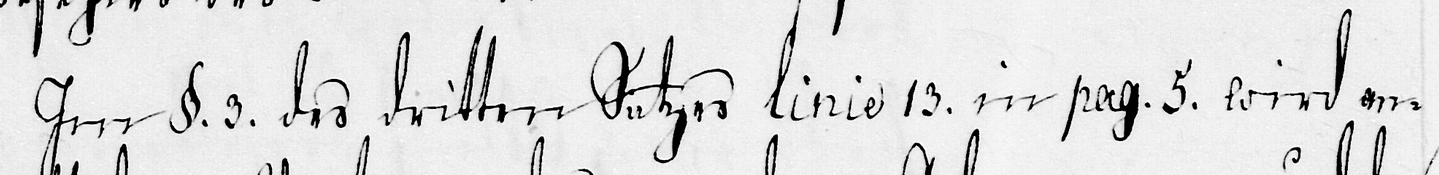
Im §. 3. des dritten Satzes linie 13. in pag. 5. wird ans¬
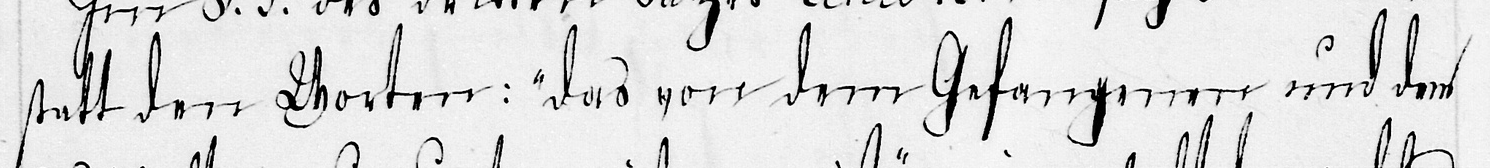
tatt den Worten: „das von dem Gefangenen und dem
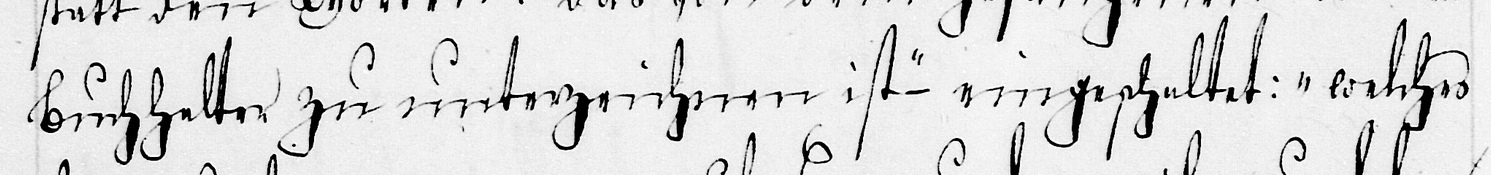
Buchhalter zu unterzeichnen ist“ – eingeschaltet: „welches
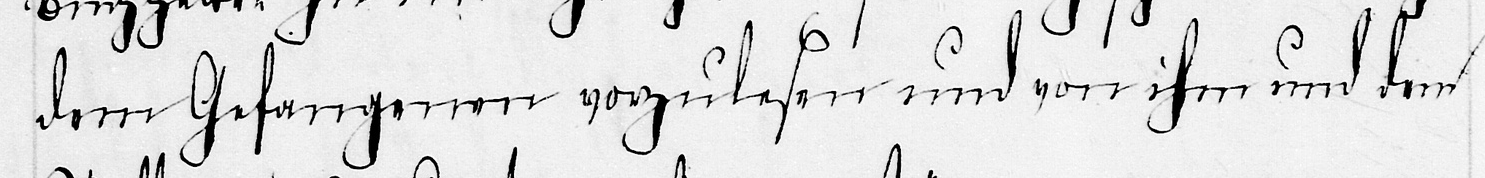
dem Gefangenen vorzulesen und von ihm und dem
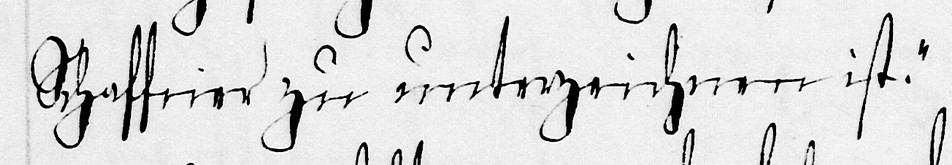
Schaffner zu unterzeichnen ist.“
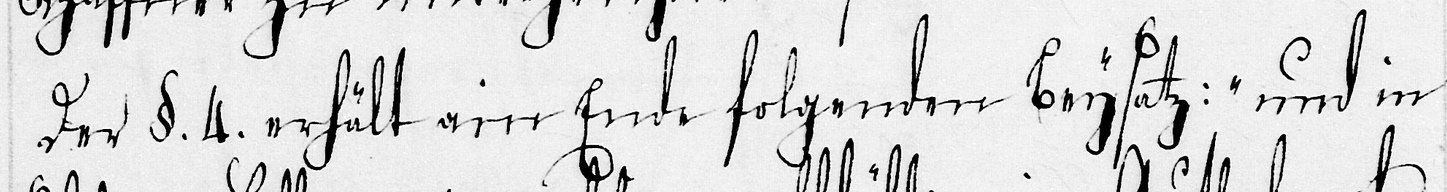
Der §. 4. erhält am Ende folgenden Beysatz: „und in
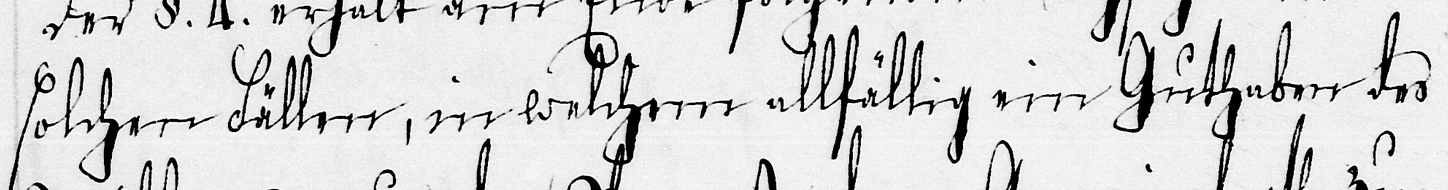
solchen Fällen, in welchem allfällig ein Guthaben des
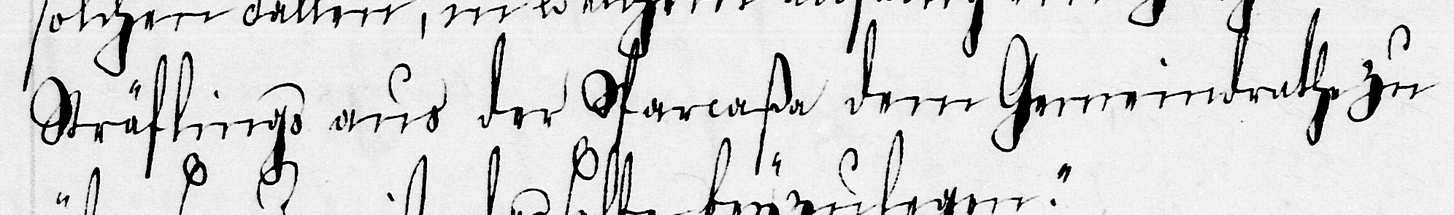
Sträflings aus der Sparcaßa dem Gemeindrathe zu
